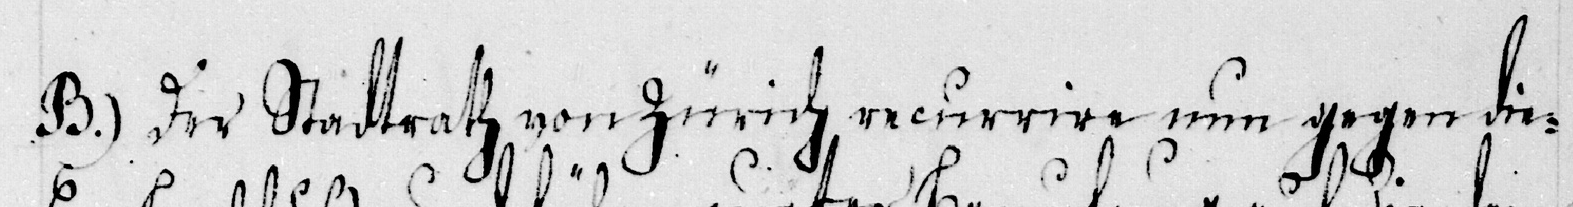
B.) Der Stadtrath von Zürich recurrire nun gegen die¬
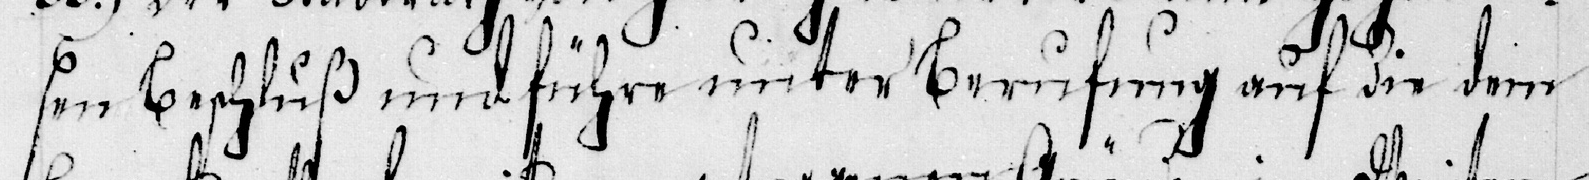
sen Beschluß und führe unter Berufung auf die dem
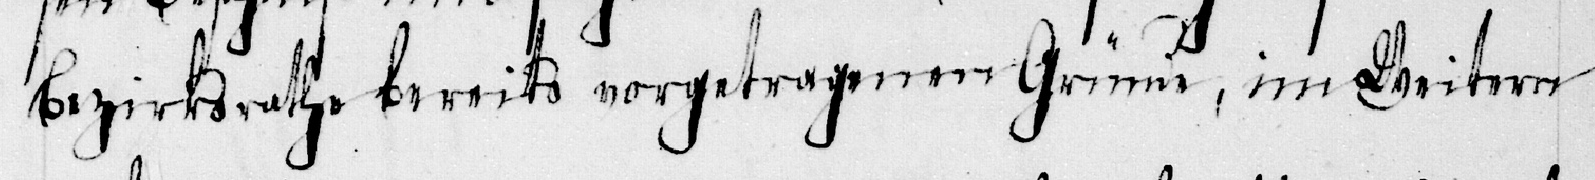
Bezirksrathe bereits vorgetragenen Gründe, im Weitern
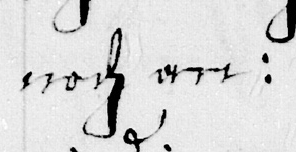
noch an:
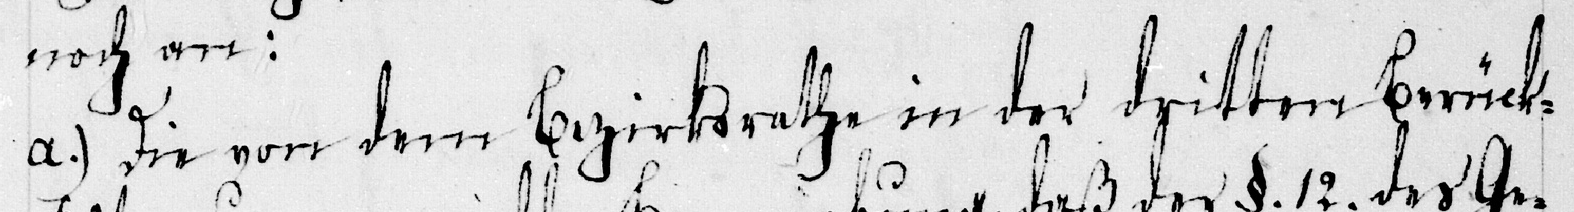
a.) Die von dem Bezirksrathe in der dritten Berück¬
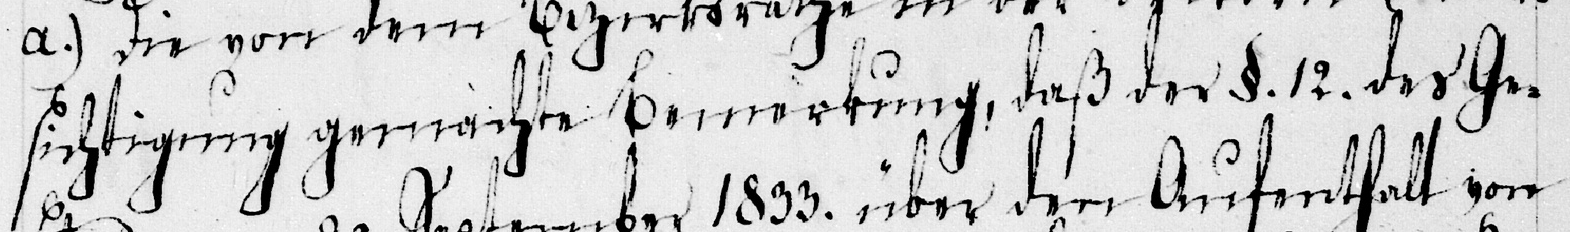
sichtigung gemachte Bemerkung, daß der §. 12. des Ge¬
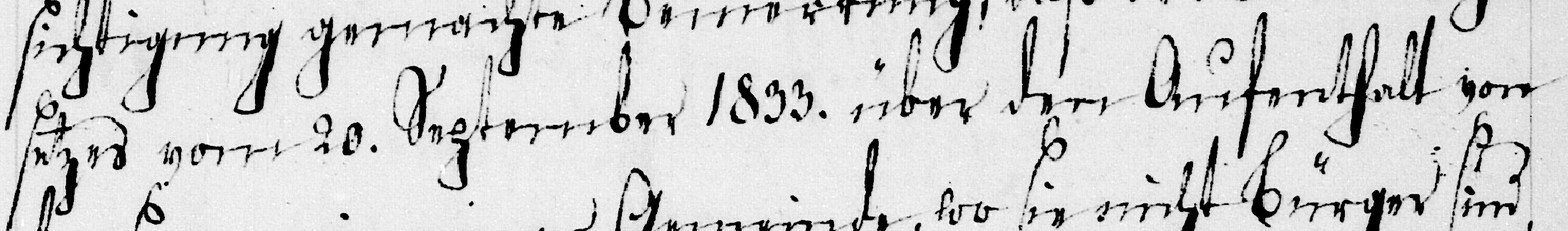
setzes vom 20. September 1833. über den Aufenthalt von
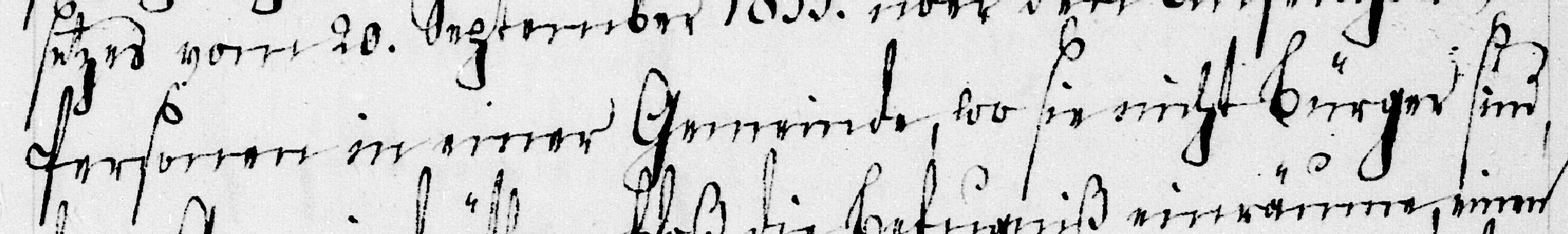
Personen in einer Gemeinde, wo sie nicht Bürger sind,
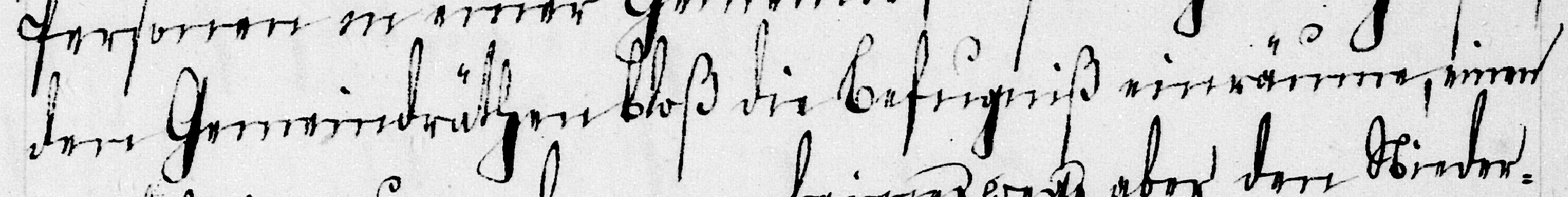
den Gemeindräthen bloß die Befugniß einräume, einen
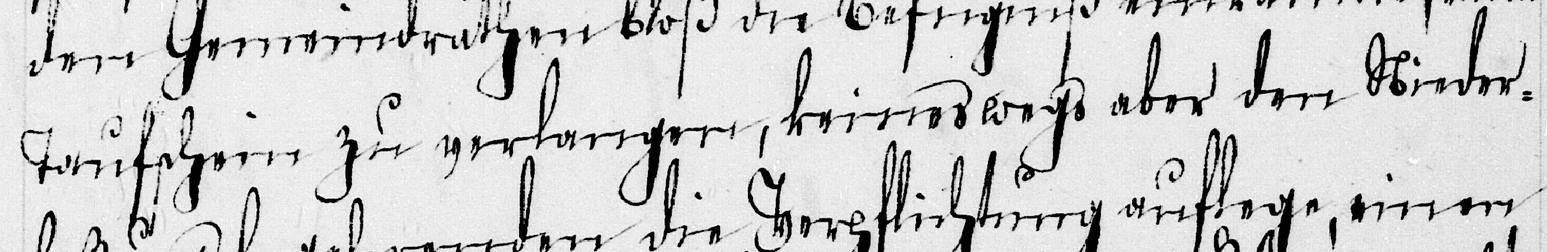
Taufschein zu verlangen, keineswegs aber den Nieder¬
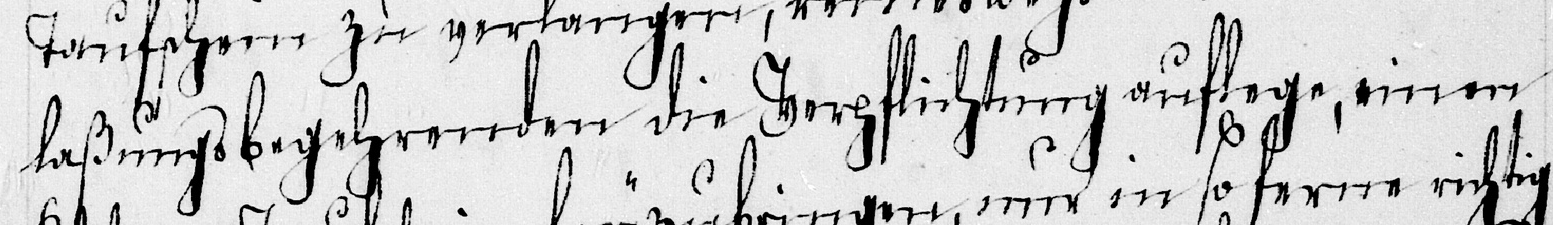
laßungsbegehrenden die Verpflichtung auflege, einen
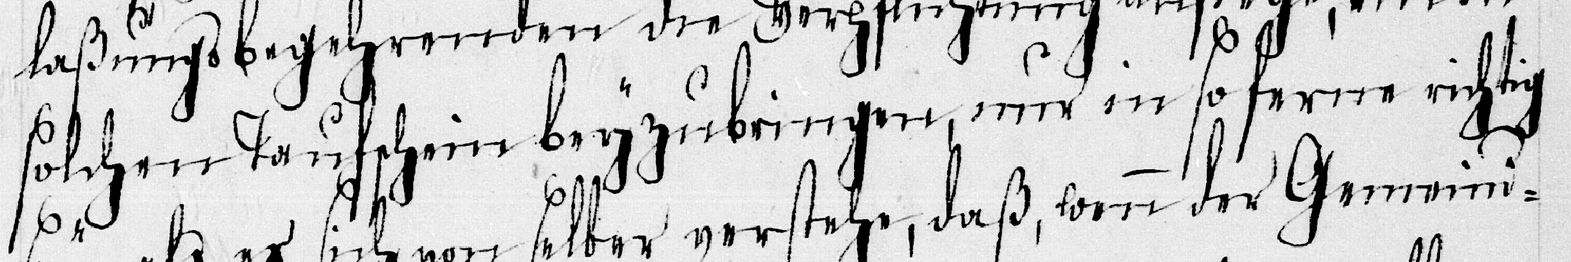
solchen Taufschein beyzubringen, nur in soferne richtig
